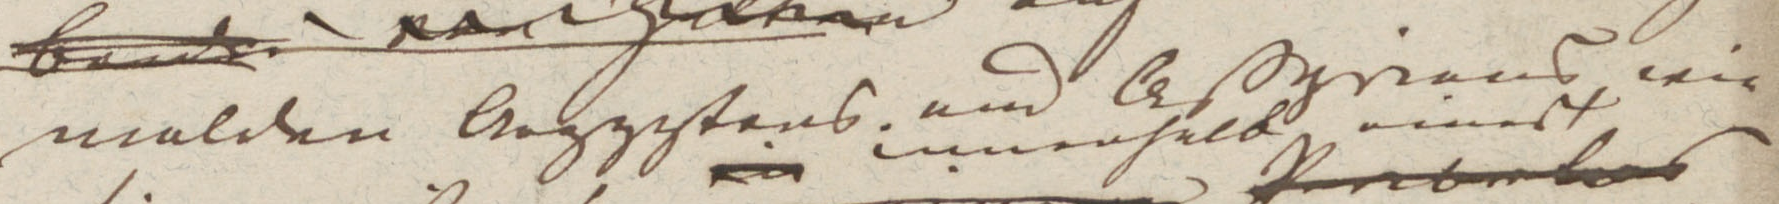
malden Aegyptens und Assyriens, wie
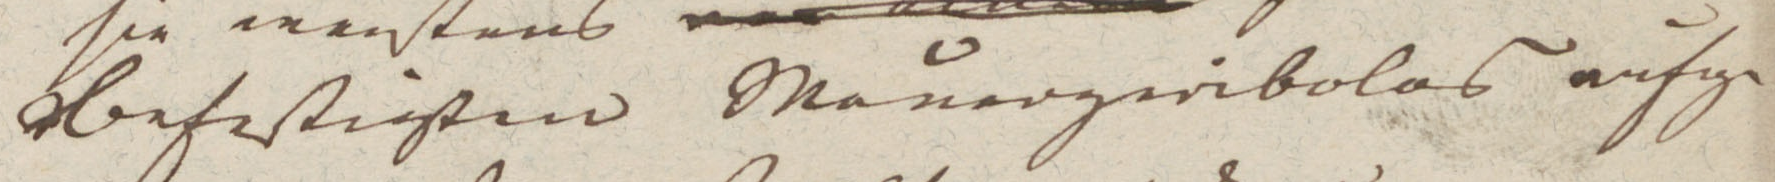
befestigten Mauerperibolos aufge-
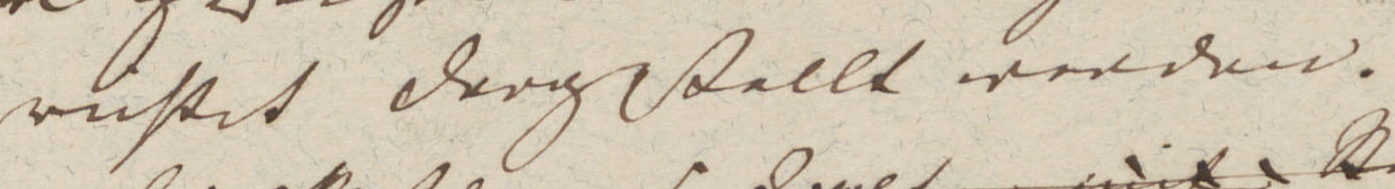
richtet dargestellt werden.
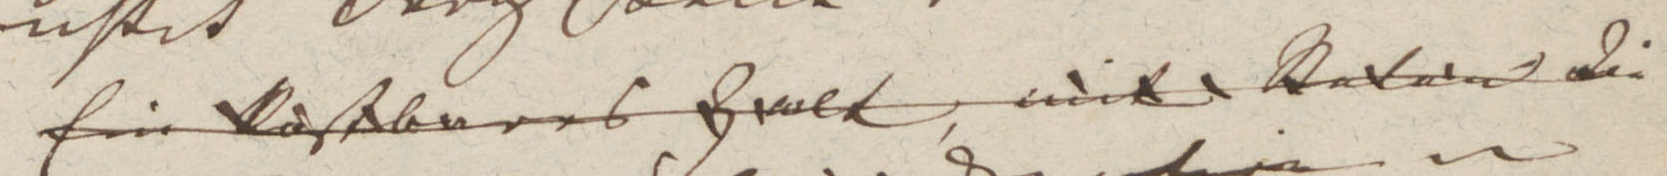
Ein kostbares Zelt, mit Stelen die
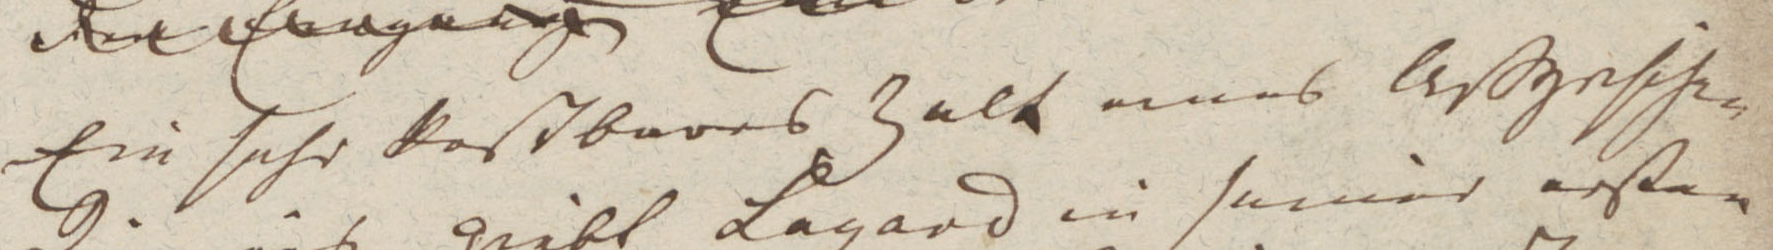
Ein sehr kostbares Zelt eines Assyrischen
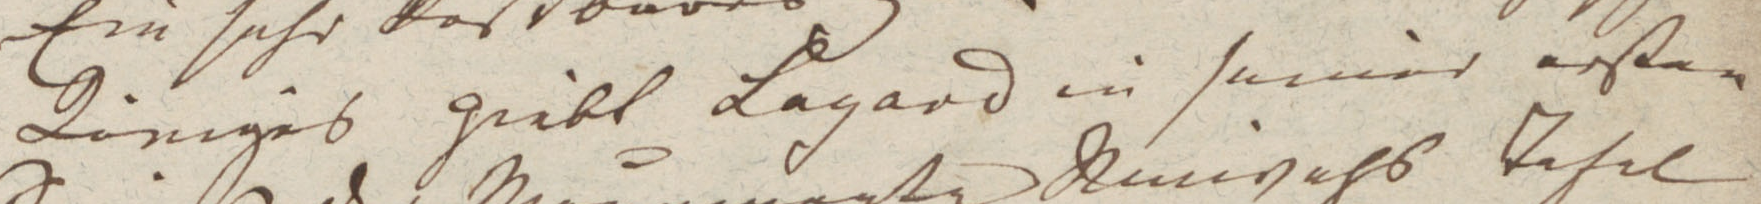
Königes giebt Layard in seiner ersten
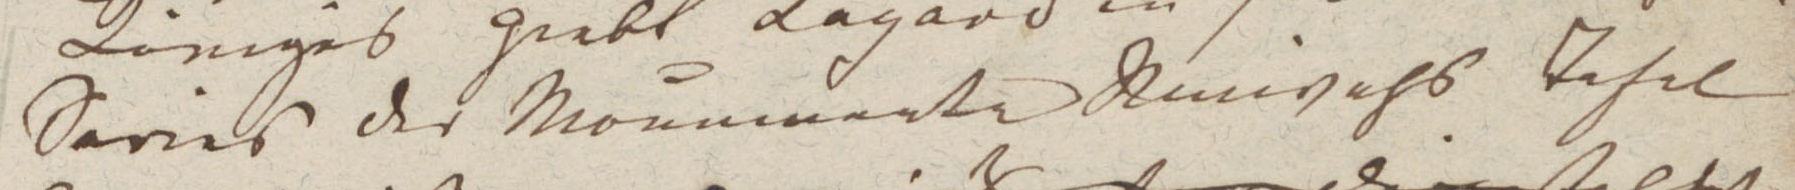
Series der Monumente Ninivehs Tafel
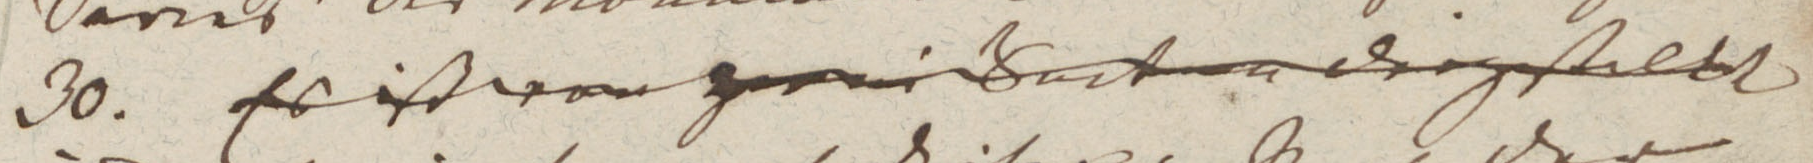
30. Es ist von zwei Seiten dargestellt
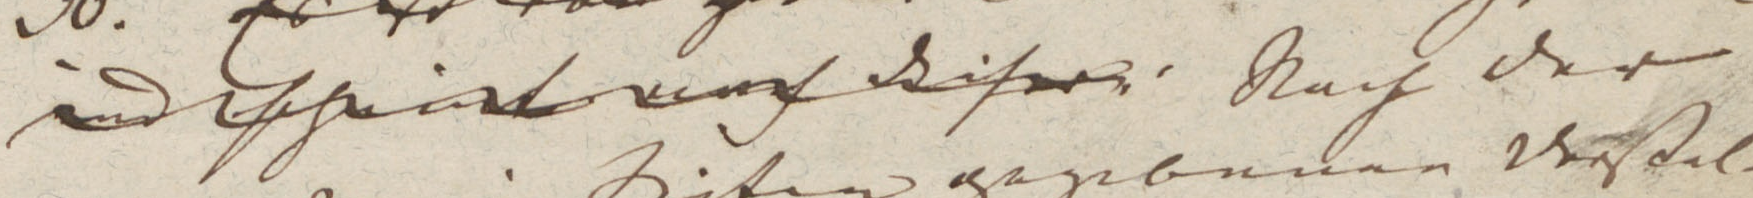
und scheint nach dieser Nach der
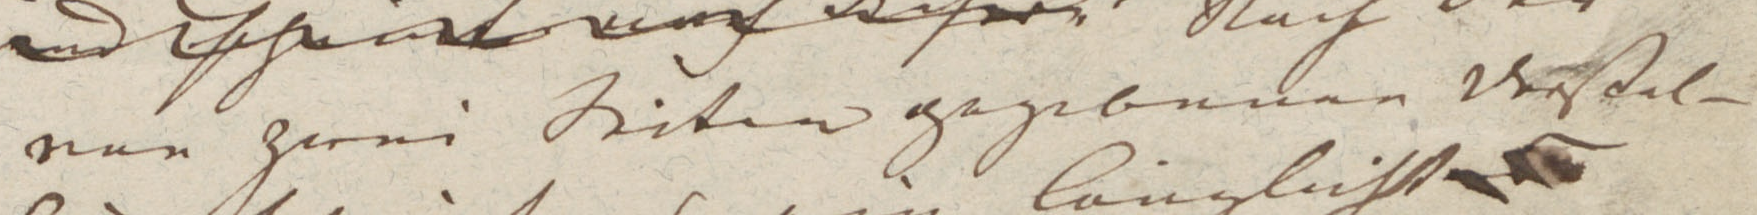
von zwei Seiten gegebenen Darstel-
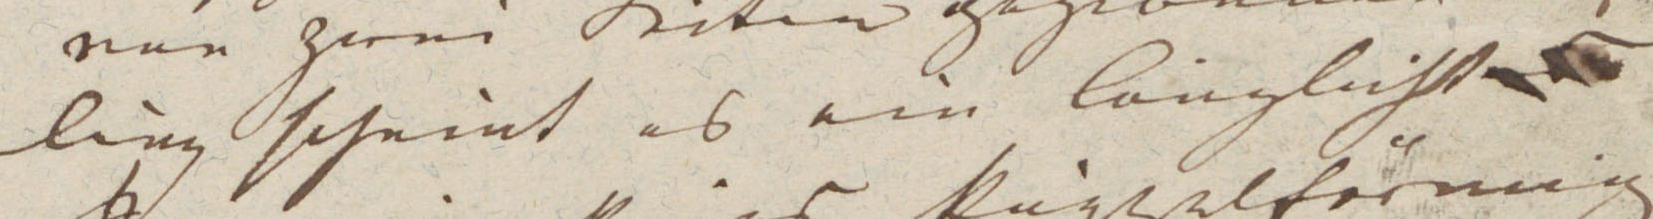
lung scheint es ein länglichtes
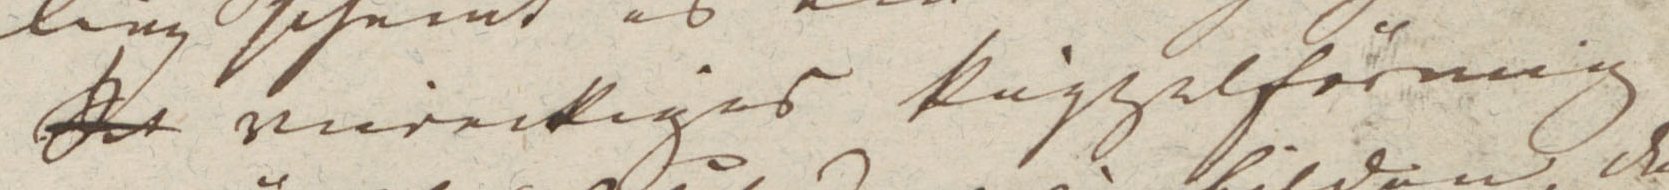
Sc viereckiges kuppelförmig
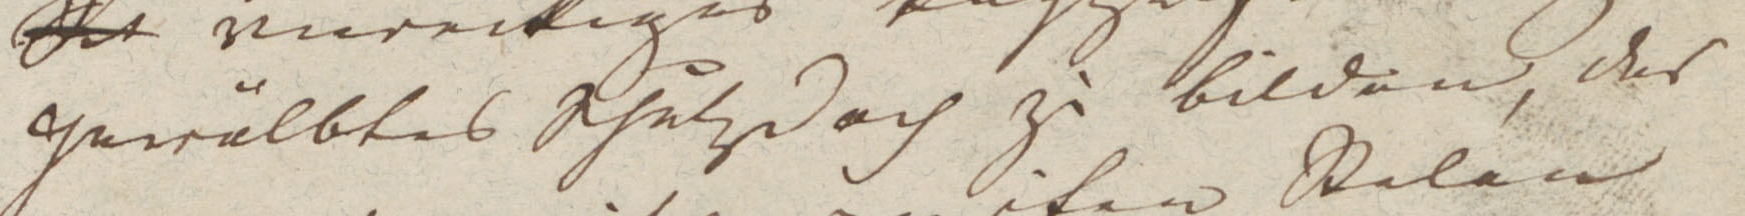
gewölbtes Schutzdach zu bilden, das
